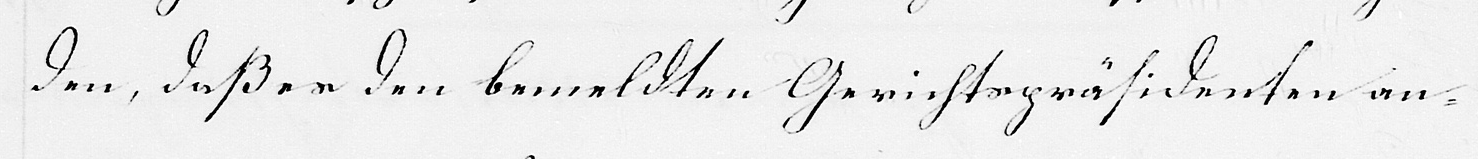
den, daß es den bemeldten Gerichtspräsidenten an¬
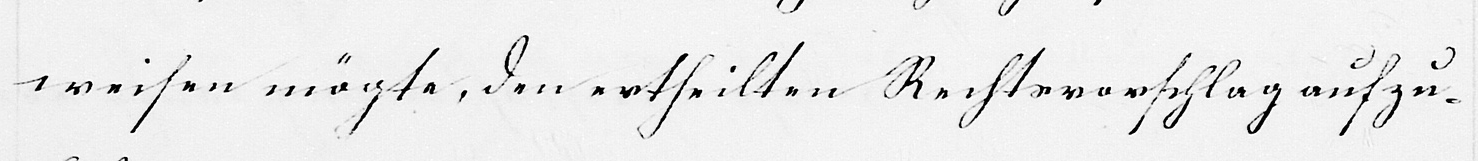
weisen mögte, den ertheilten Rechtsvorschlag aufzu¬
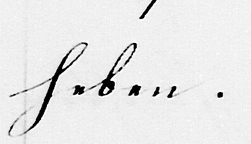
heben.
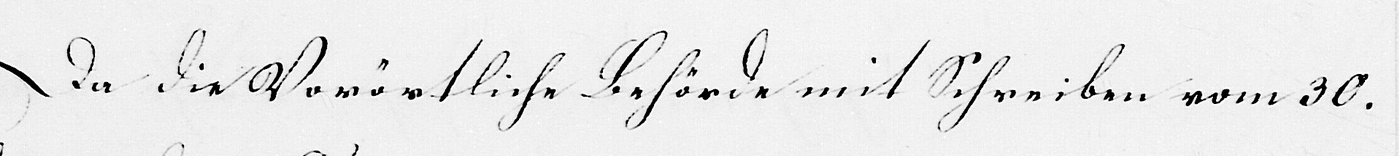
Da die Vorörtliche Behörde mit Schreiben vom 30.
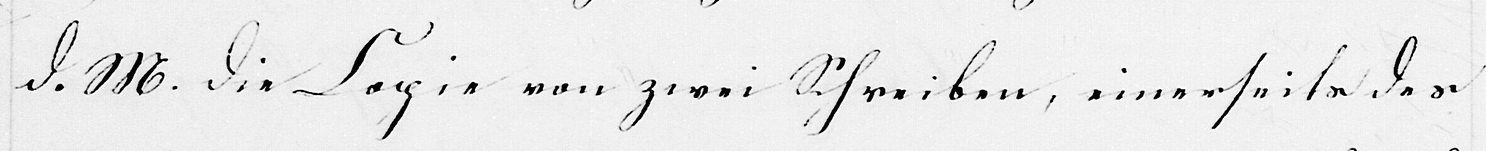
d. M. die Copie von zwey Schreiben, einerseits des
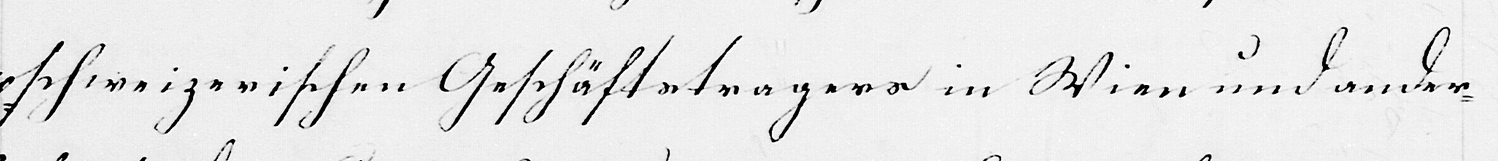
schweizerischen Geschäftstragers in Wien und ander¬
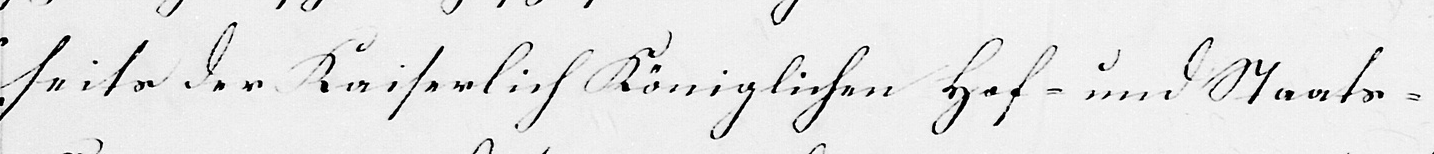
seits der Kaiserlich Königlichen Hof- und Staat¬
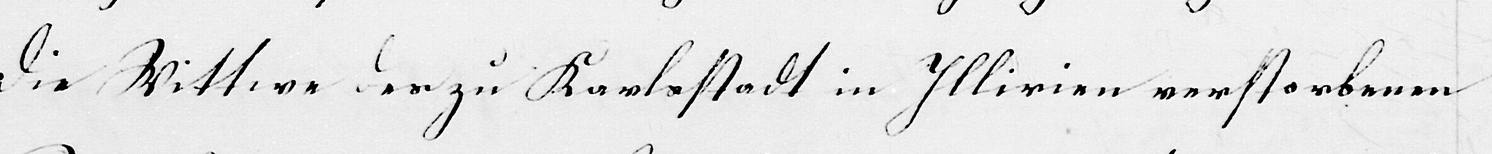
die Wittwe des zu Karlsstadt in Illirien verstorbenen
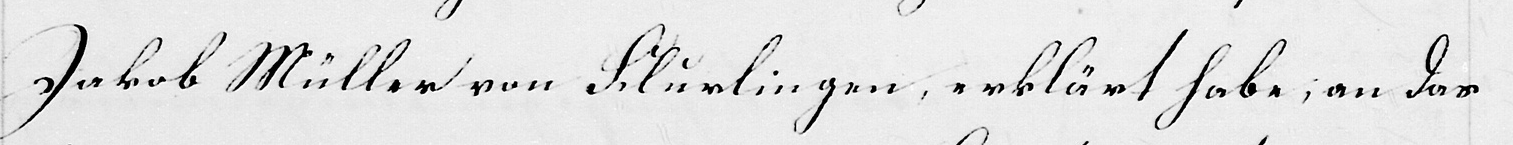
Jakob Müller von Flurlingen, erklärt habe, an das
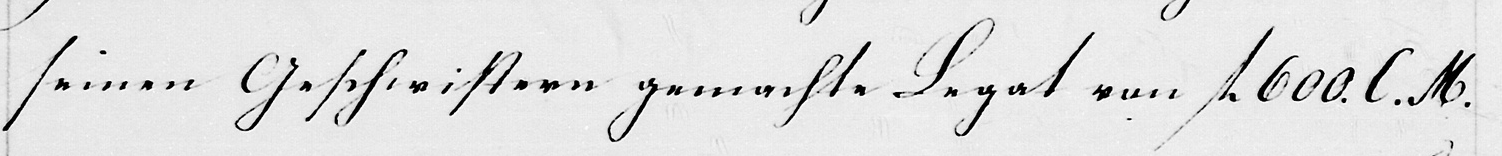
seinen Geschwistern gemachte Legat von fl 600. C. M.
